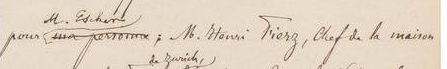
pour ma personneM. Escher; M. Henri Fierz, Chef de la maison
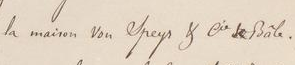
la maison von Speyr & Cie de Bâle.
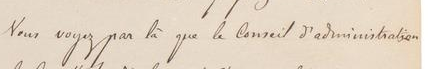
Vous voyez par là que le Conseil d'administration
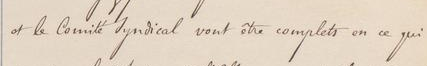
et le Comité Syndical vont être complets en ce qui
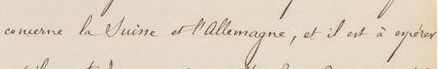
concerne la Suisse et l'Allemagne, et il est à espérer
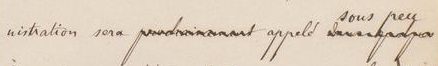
nistration sera prochainement appelé sous peudans
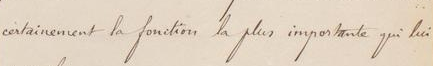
certainement la fonction la plus importante qui lui
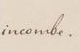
incombe.
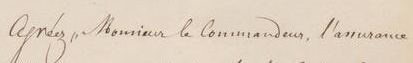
Agréez, Monsieur le Commandeur, l'assurance
